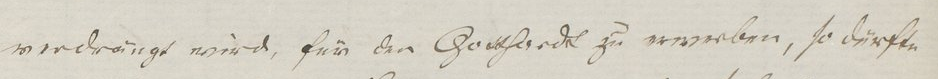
verdrängt wird, für den Gotthardt erwerben, so dürfte
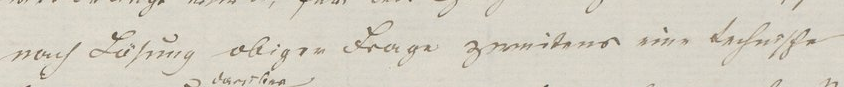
nach Lösung obiger Frage zweitens eine technische
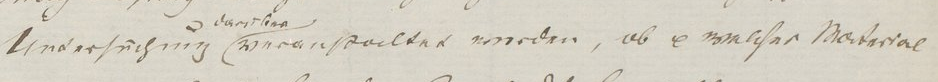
Untersuchung darüber veranstaltet werden, ob & welches Material
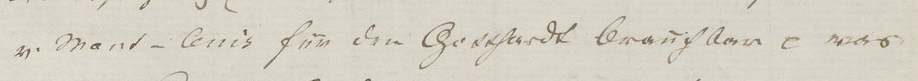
v. Mont-Cenis für den Gotthardt brauchbar & was
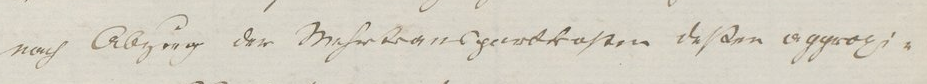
nach Abzug der Mehrtransportkosten deßen approxi-
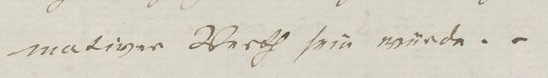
mativer Werth sein würde. –
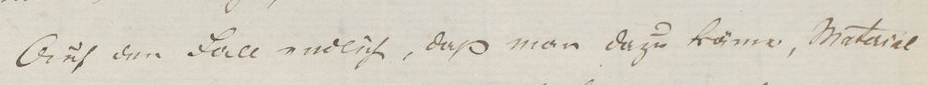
Auf den Fall endlich, daß man dazu käme, Material
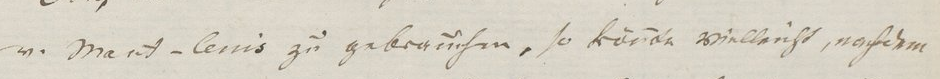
v. Mont-Cenis zu gebrauchen, so könnte vielleicht, nachdem
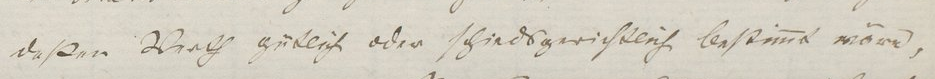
deßen Werth gütlich oder schiedsgerichtlich bestimmt wäre,
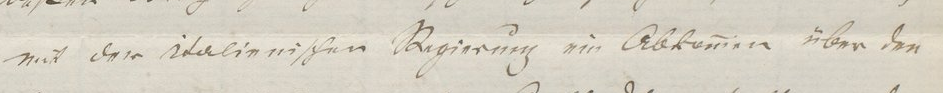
mit der italienischen Regierung ein Abkommen über den
